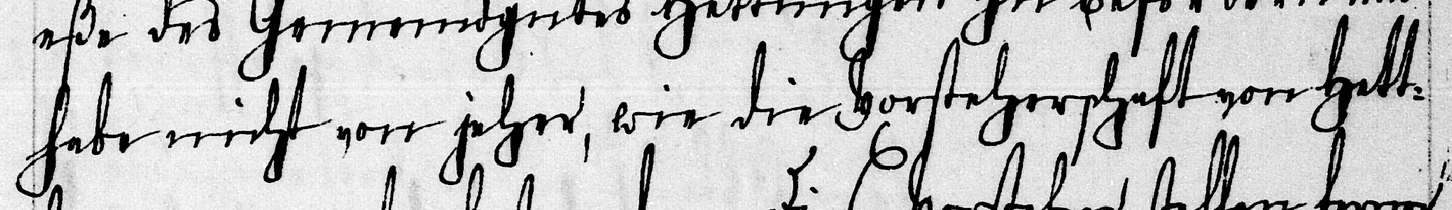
habe nicht von jeher, wie die Vorsteherschaft von Hett¬
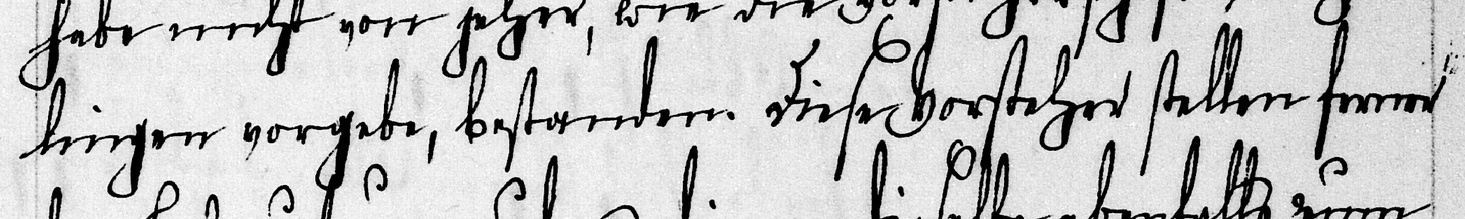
lingen vorgebe, bestanden. Diese Vorsteher stellen ferner
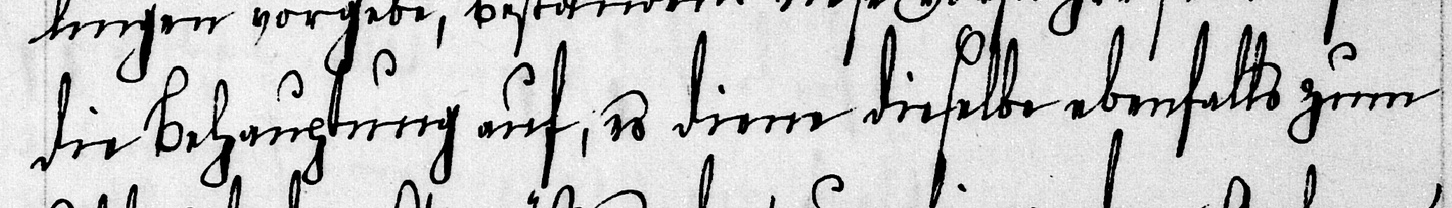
die Behauptung auf, es diene dieselbe ebenfalls zum
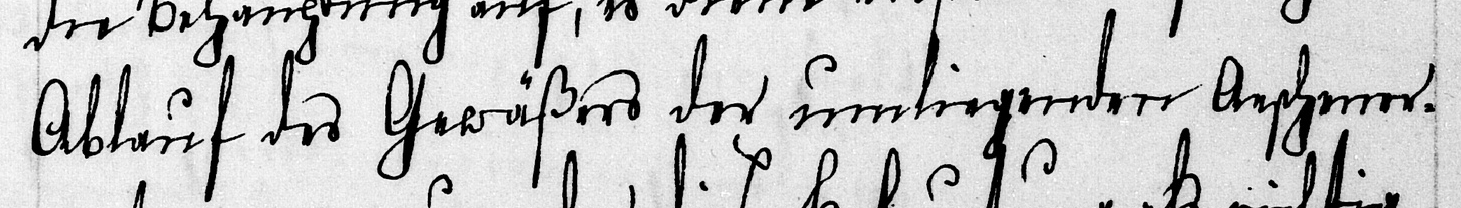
Ablauf des Gewäßers der umliegenden Aeschener¬
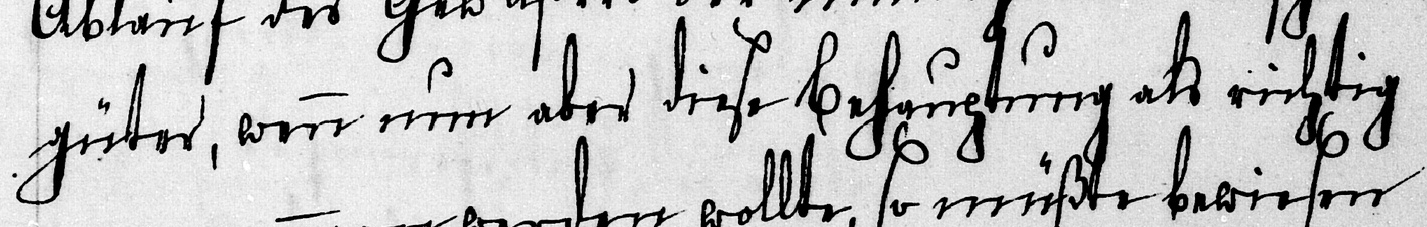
güter, wenn nun aber diese Behauptung als richtig
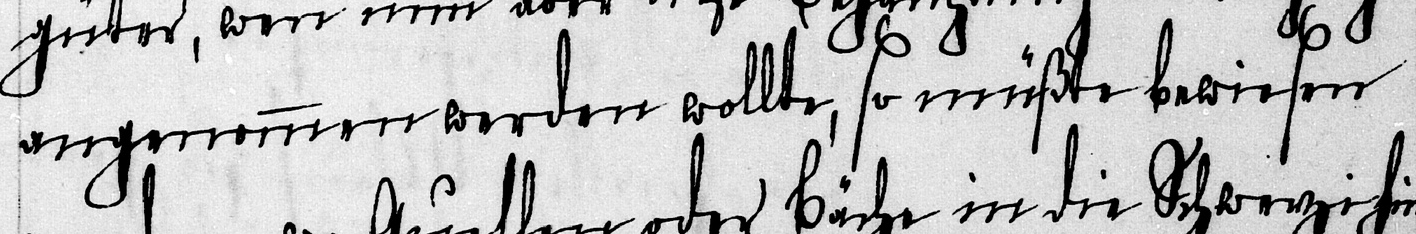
angenommen werden wollte, so müßte bewiesen
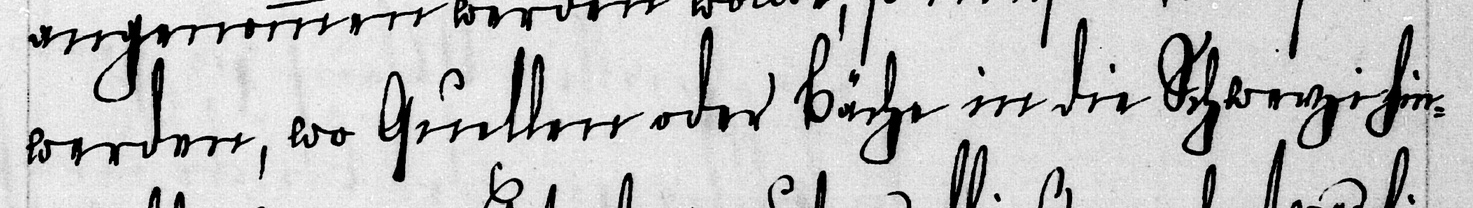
werden, wo Quellen oder Bäche in die Schwerzi hin¬
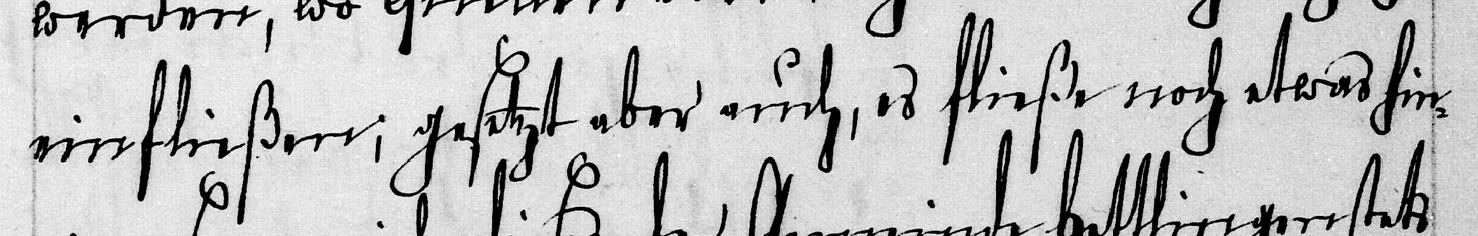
einfließen; gesetzt aber auch, es fließe noch etwas hin¬
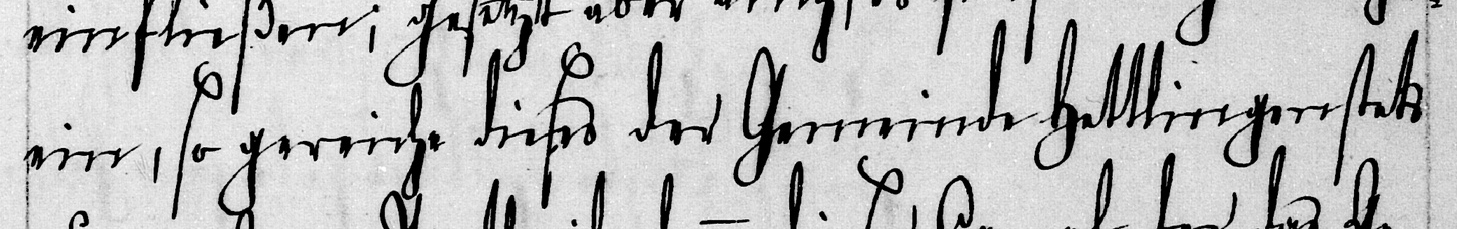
ein, so gereiche dieses der Gemeinde Hettlingen stets
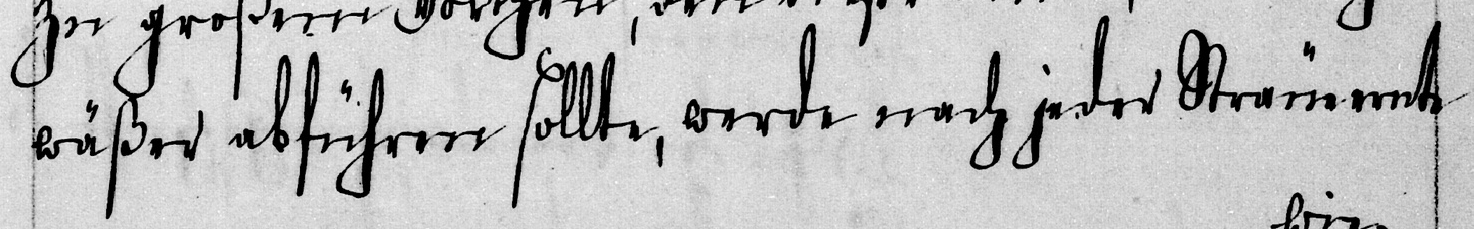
wäßer abführen sollte, werde nach jeder Sträuernte
